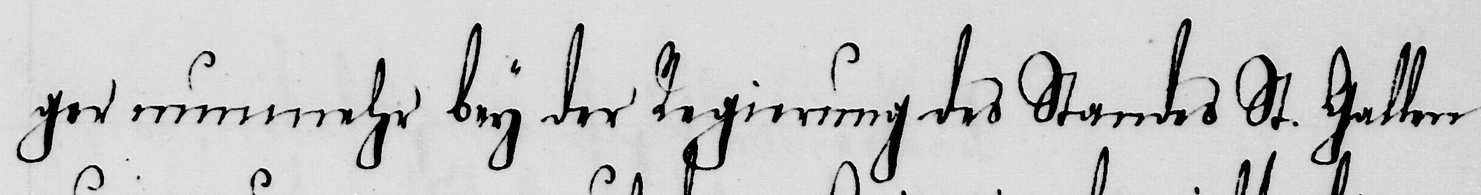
ger nunmehr bey der Regierung des Standes St. Gallen
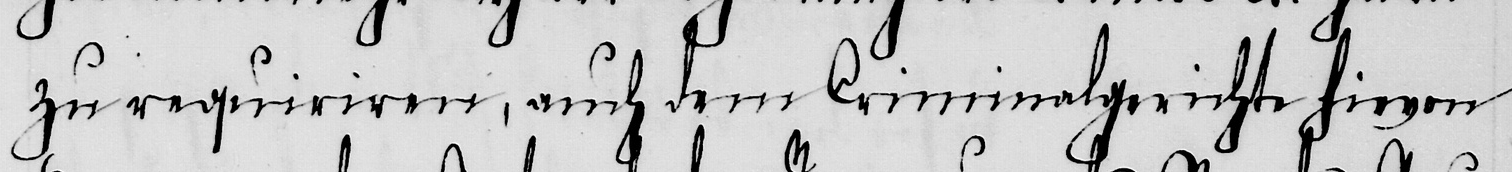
zu requiriren, auch dem Criminalgerichte hievon
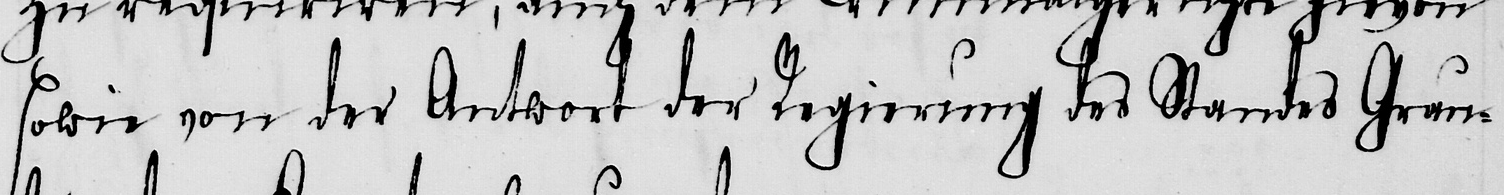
sowie von der Antwort der Regierung des Standes Grau¬
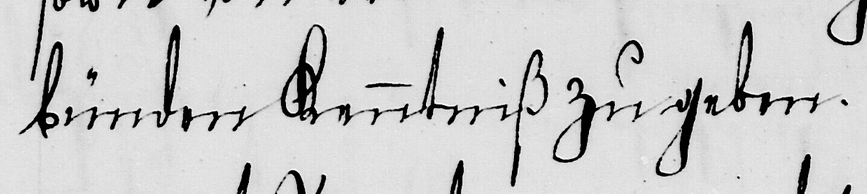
bünden Kenntniß zu geben.
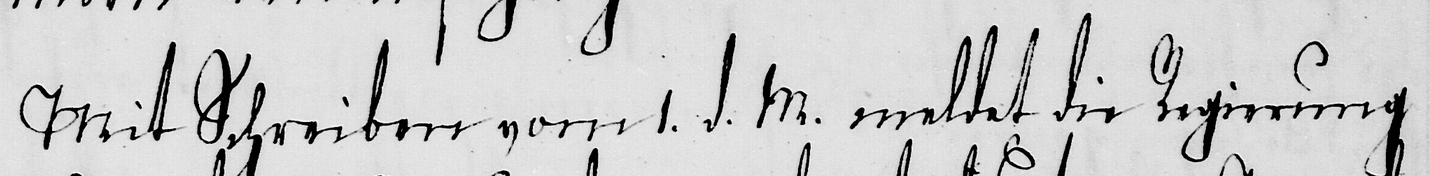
Mit Schreiben vom 1. d. M. meldet die Regierung
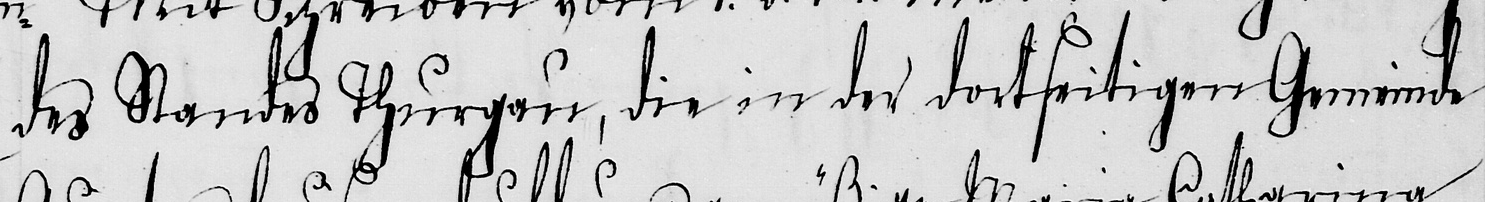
des Standes Thurgau, die in der dortseitigen Gemeinde
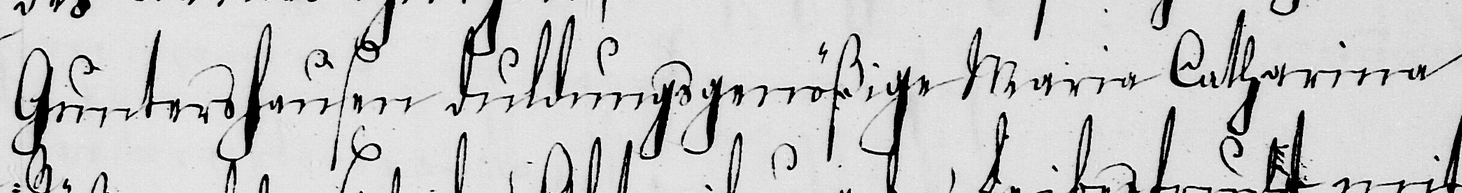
Guntershausen duldungsgenößige Maria Catharina
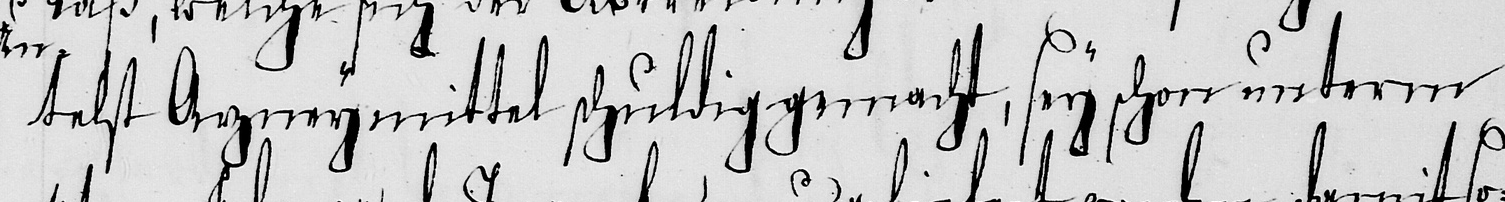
telst Arzneymittel schuldig gemacht, sey schon unterm
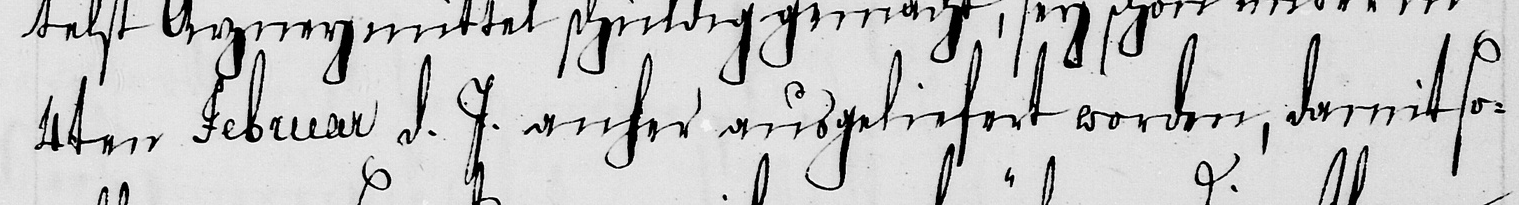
4ten Februar d. J. anher ausgeliefert worden, damit so¬
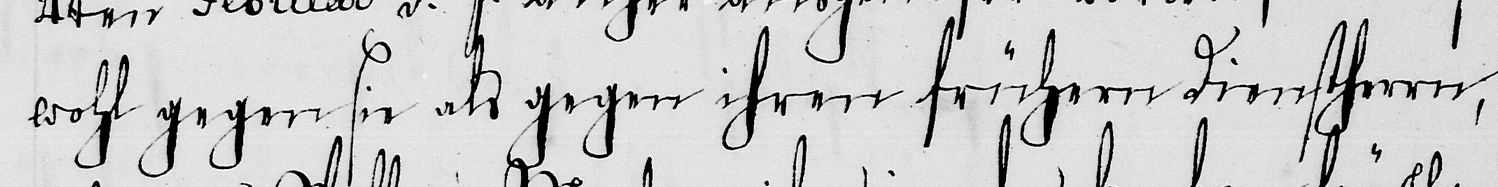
wohl gegen sie als gegen ihren frühern Dienstherrn,
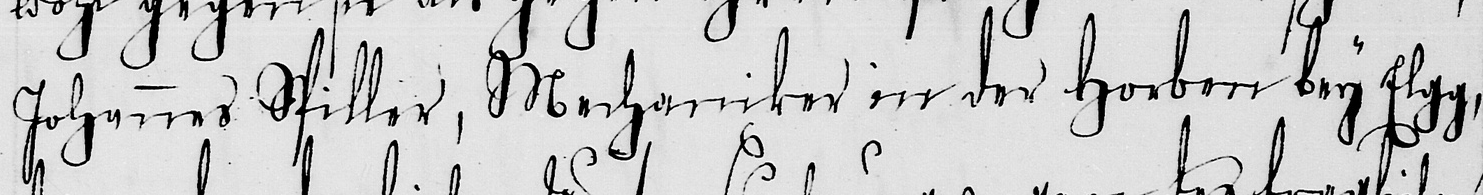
Johannes Spiller, Mechaniker in der Horben bey Elgg,
